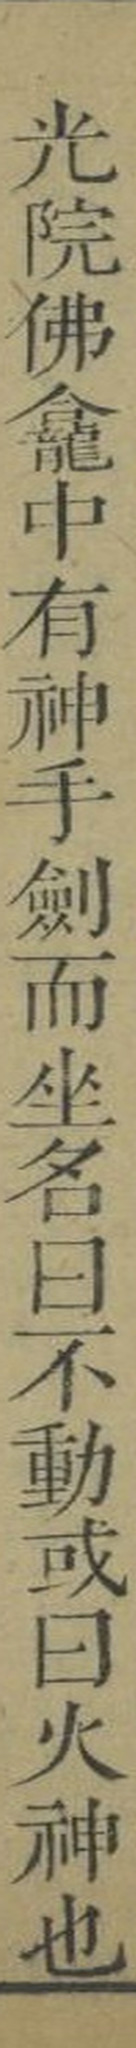光院仏龕中有神手剣而坐名曰不動或曰火神也
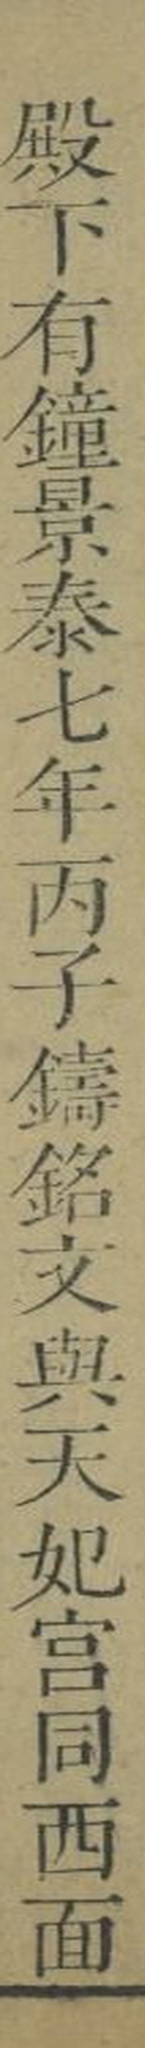殿下有鐘景泰七年丙子鋳銘文与天妃宮同西面
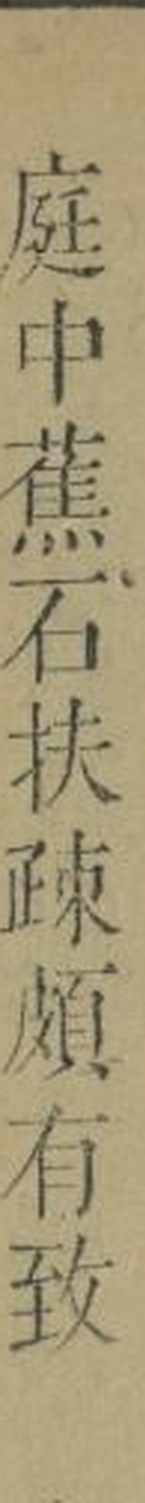庭中蕉石扶疎頗有致
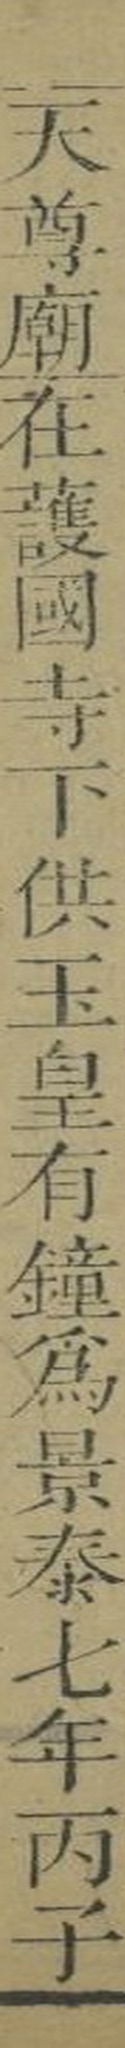[天尊廟]在護国寺下供玉皇有鐘為景泰七年丙子
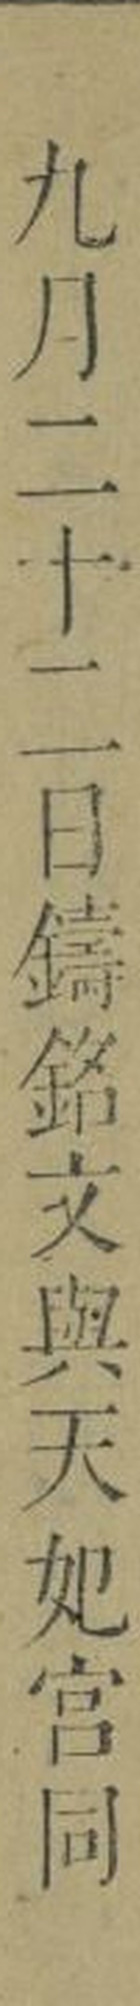九月二十二日鋳銘文与天妃宮同
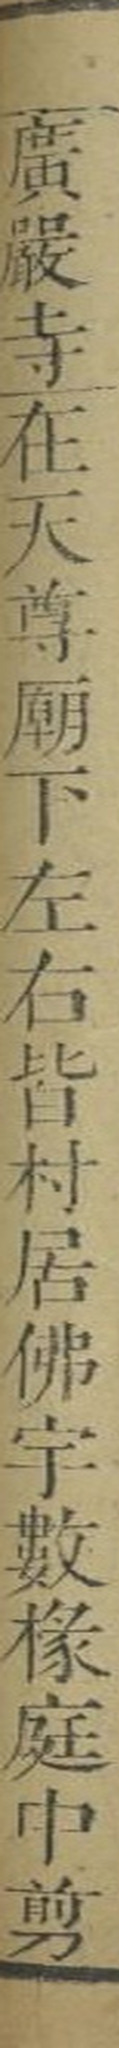[広厳寺]在天尊廟下左右皆村居仏宇数椽庭中剪
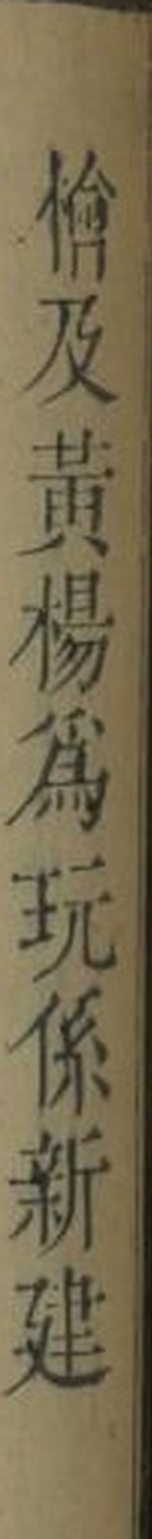桧及黄楊為玩係新建
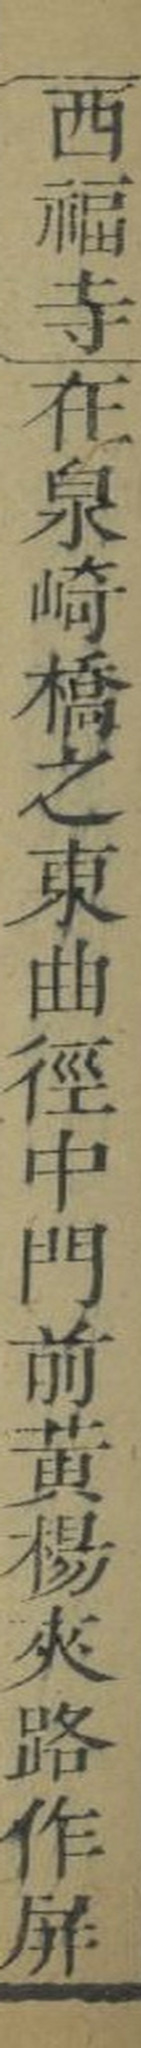[西福寺]在泉崎橋之東曲径中門前黄楊夾路作屏
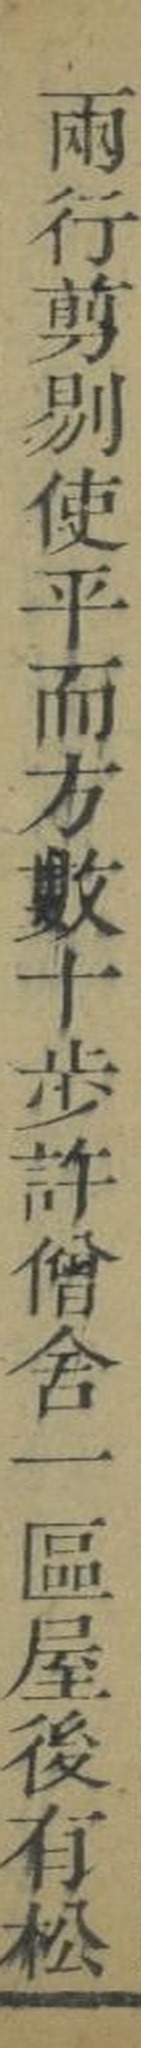両行剪剔使平而方数十歩許僧舎一区屋後有松
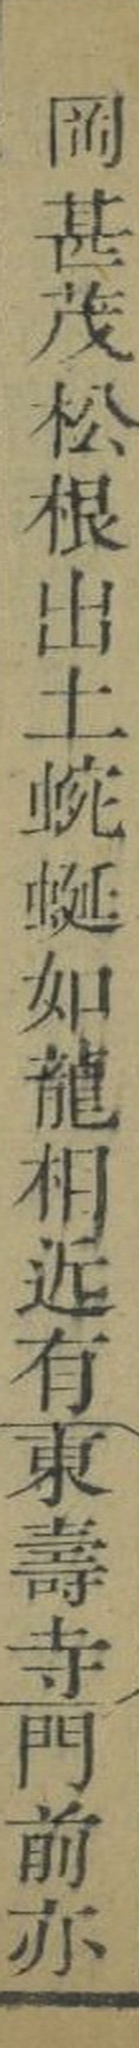岡甚茂松根出土蜿蜒如竜相近有[東寿寺]門前亦
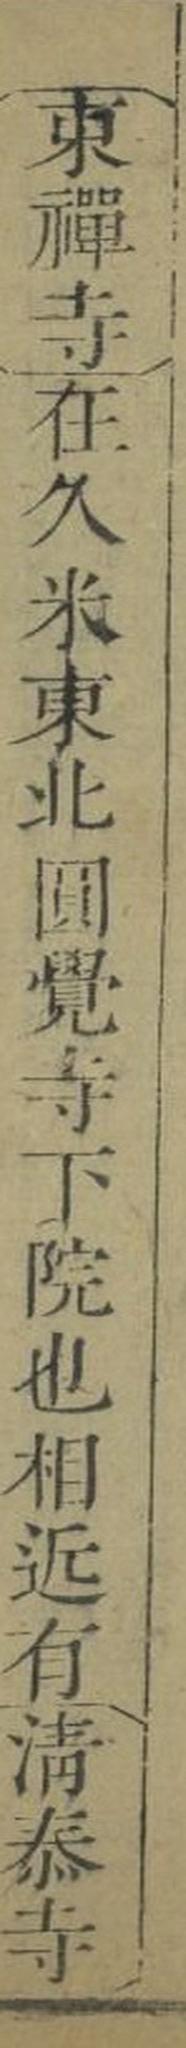[東禅寺]在久米東北円覚寺下院也相近有[清泰寺]
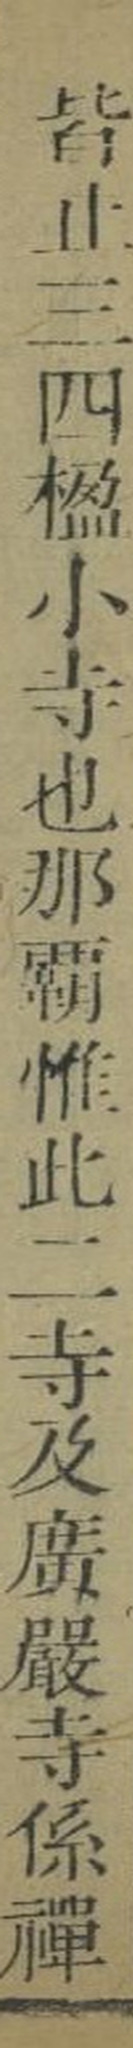皆止三四楹小寺也那覇惟此二寺及広厳寺係禅
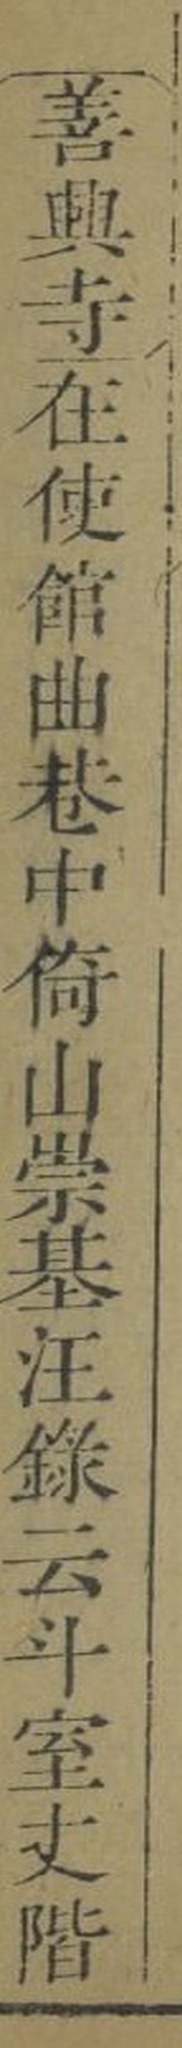[善興寺]在使館曲巷中倚山崇基汪録云斗室丈階

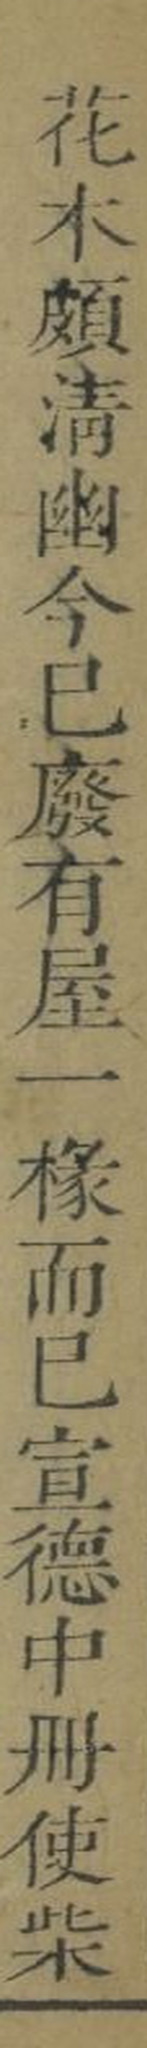花木頗清幽今巳廃有屋一椽而巳宣徳中冊使柴
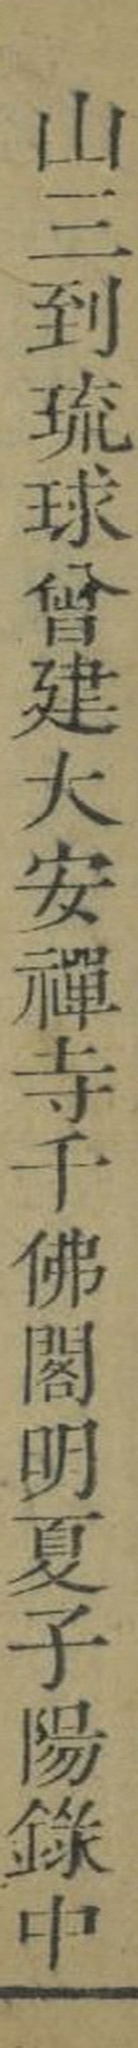山三到琉球曽建大安禅寺千仏閣明夏子陽録中
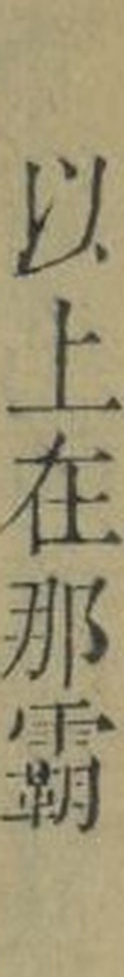以上在那覇
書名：中山伝信録 巻四
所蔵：University of the Ryukyus Library
